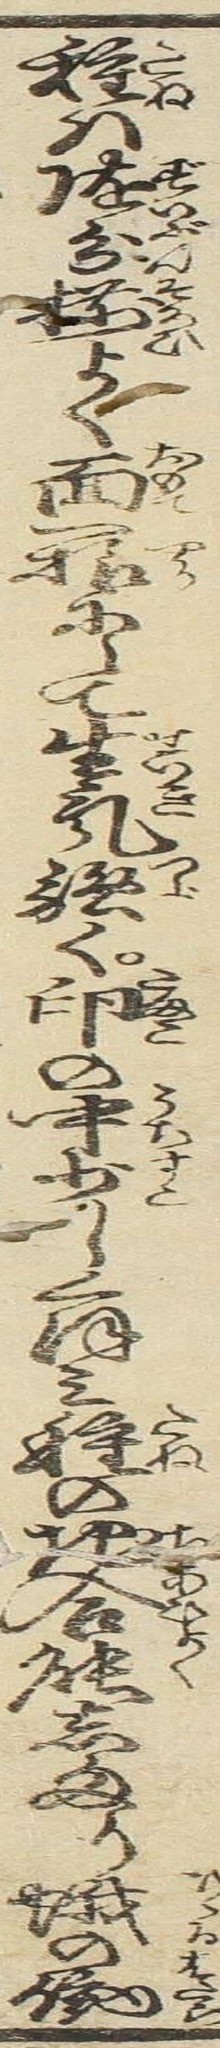種は随分揃よく面一様にして生気強く。卵の中少しくほみ種の地合能しまり蛾の働
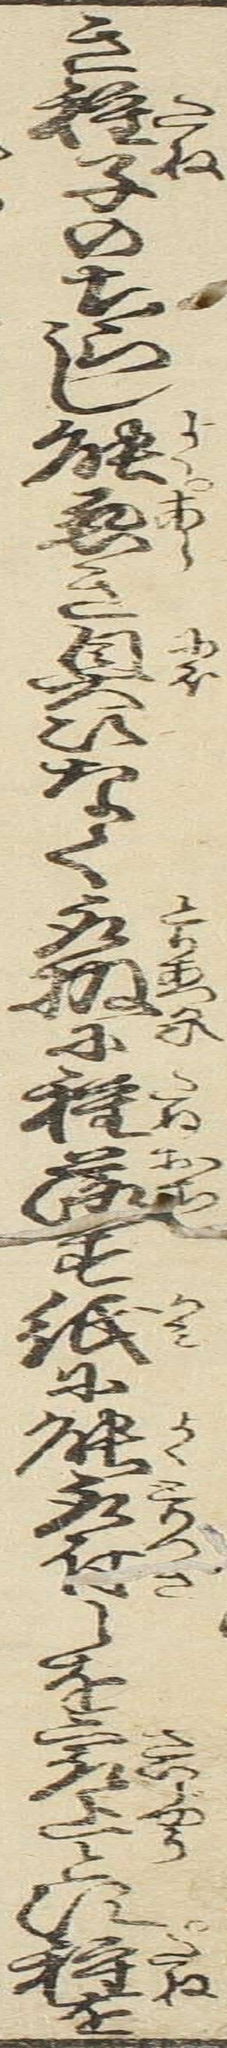き種子のちらし能。悪き臭ひなく取扱に種落す紙に能取付しを最上とす。種を
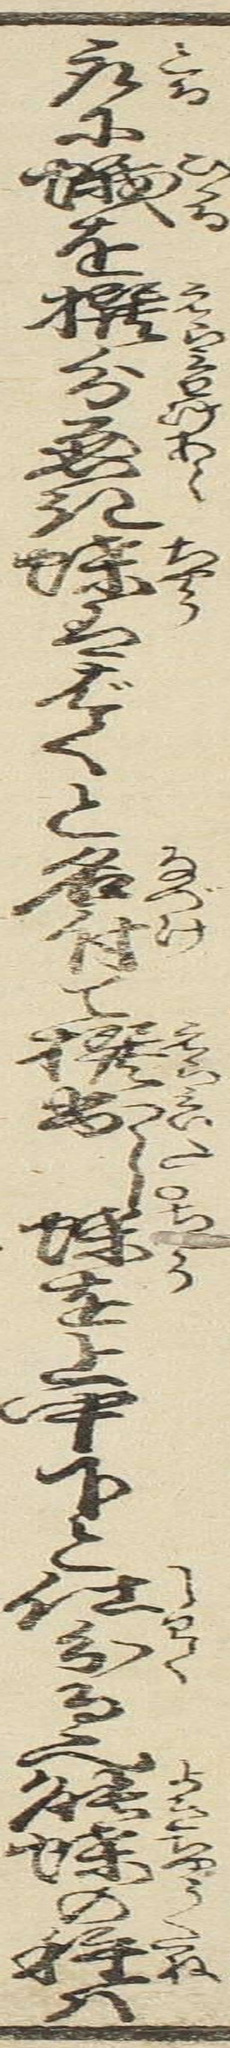取に蛾を撰分悪き蝶はばくと名付て選出し。蝶を上中下と仕分る也能蝶の種は
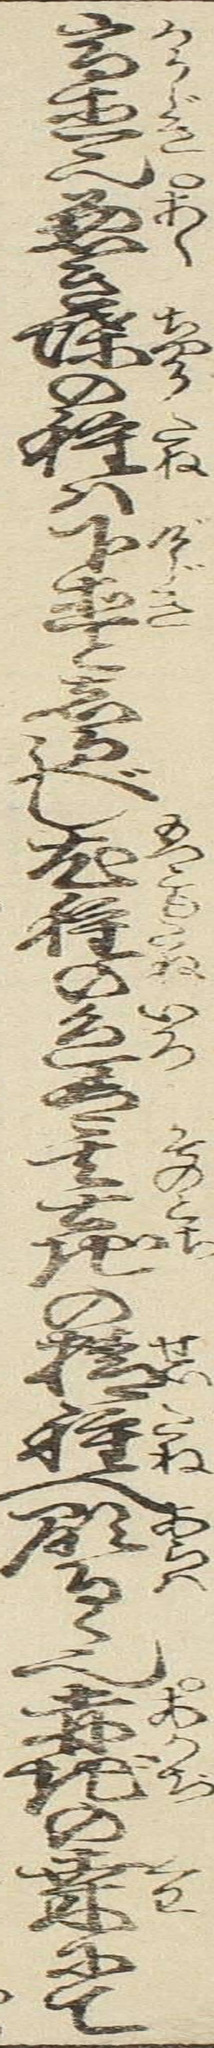高直也。悪き蝶の種は下直としるべし尤種の色は其土地の精種へ顕るゝ也。赤地の桑にて
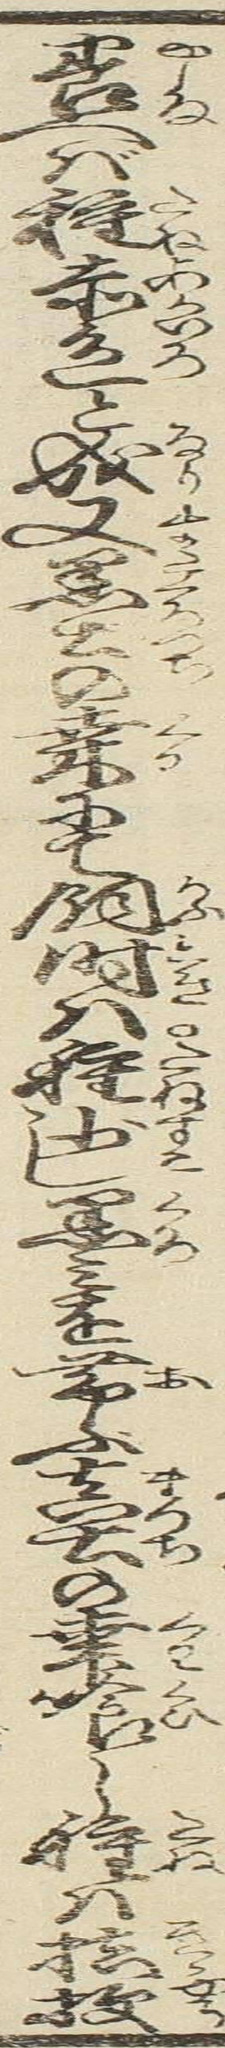養へば種赤色と成又黒土の桑にて飼時は。種少し黒みを帯ふ真土の桑喰し種は桔梗
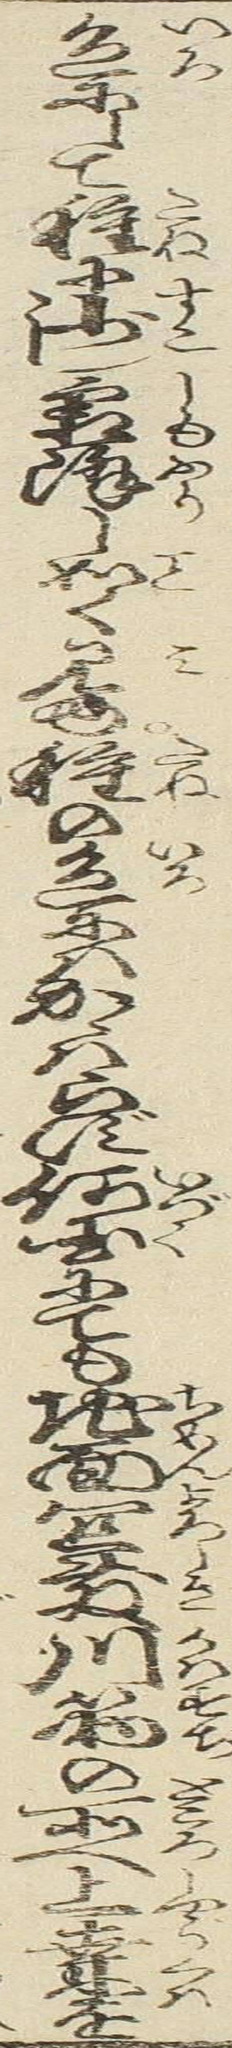色にして種に少し霜降し如く見ゆ。種の色にはかゝはらず何国にても地面宜敷川筋の所へ上桑を
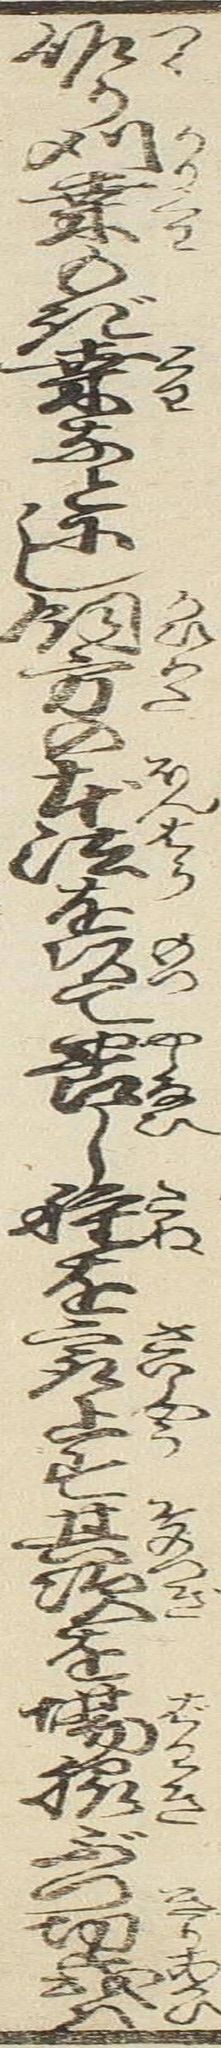作り刈桑もぎ桑なとにし飼方の本法を以て養し種を最上す其次を場脇ぶつ切或は
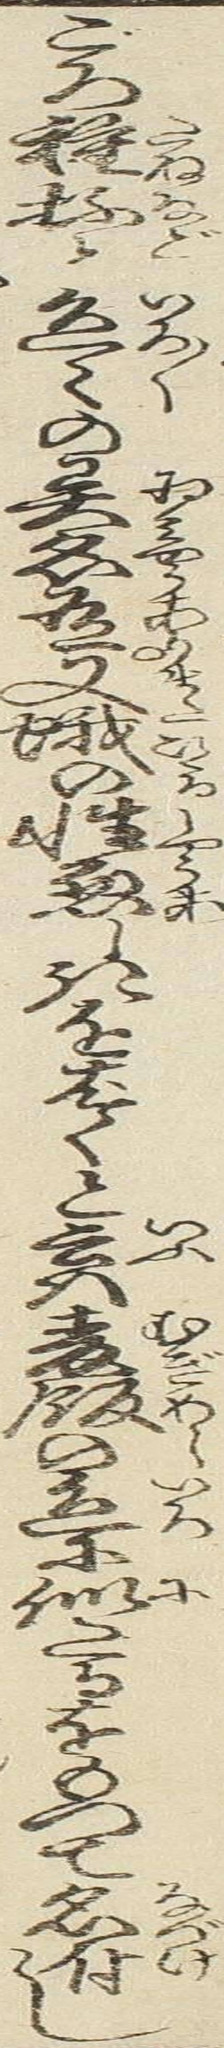ころ種抔色々の異名有。又蛾の性悪しきをはくと云は麦飯の色に似たるををもつて名付し
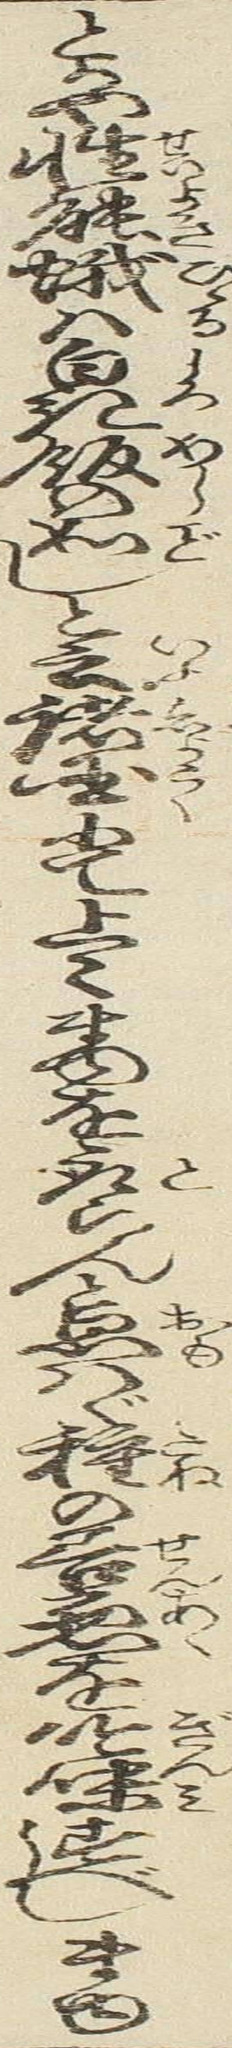とかや性能蛾は白き飯の如しと云諸国にて上々まゆを取らんと思はゞ種の善悪を吟味すべしまゆ
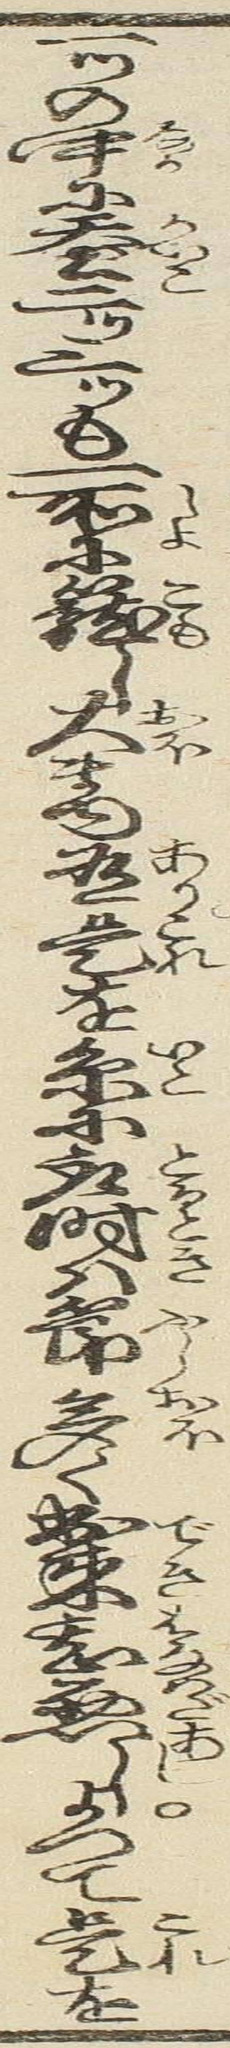一つの中に蚕二つ三つも一所に籠し大まゆ有。是を糸に取時は節多く出来甚悪し。よつて是を
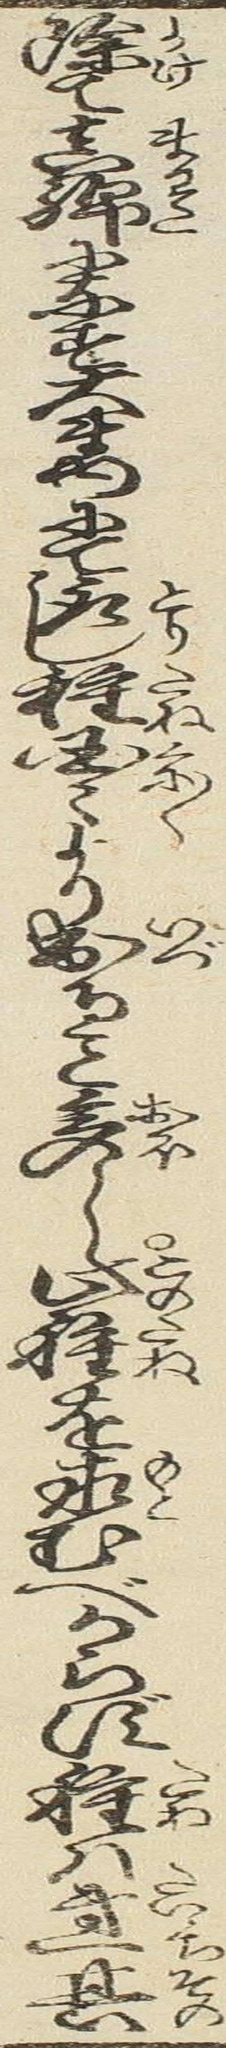除て真綿になす大まゆにて取し種国々より出ること多し。此種を求むべからず種は第一其
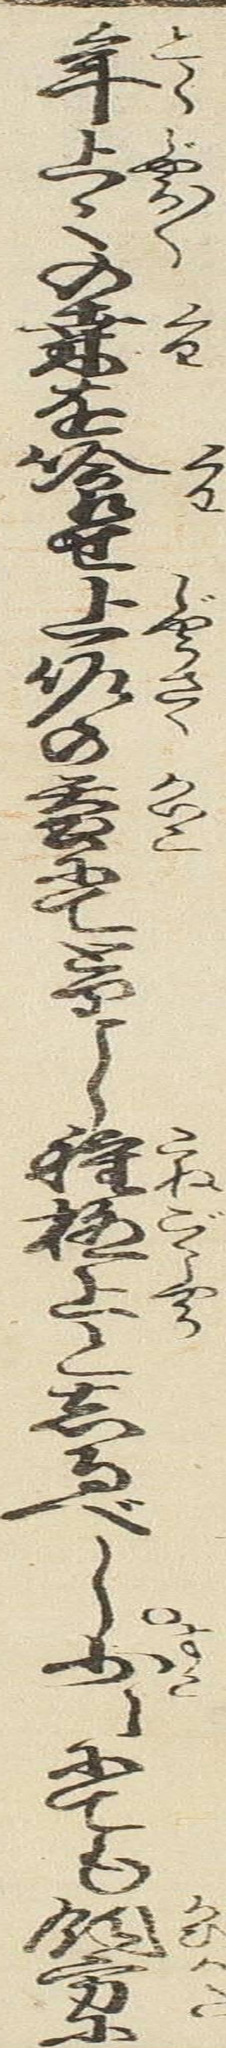年上々の桑を喰せ上作の蚕にてとりし種極上としるべし。少しにても飼方に
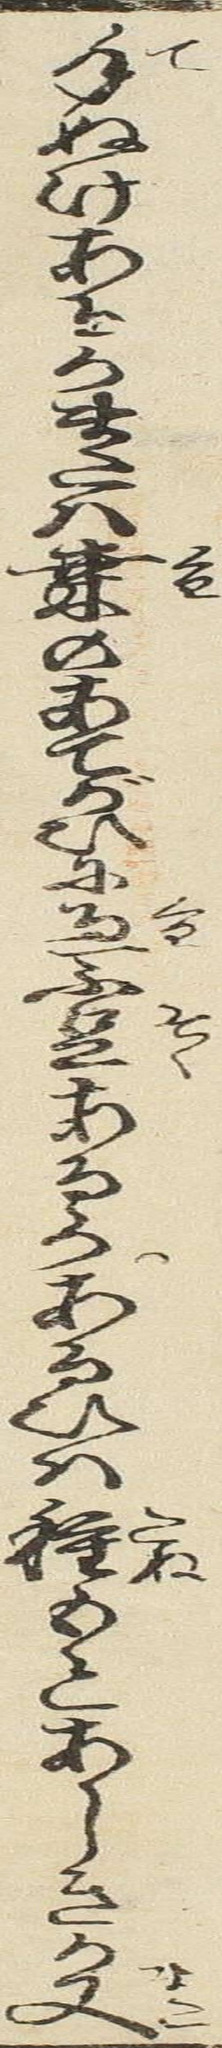手ぬけあるかまたは桑のあてがひに過不足あるか。あるひは種もとあしきか又
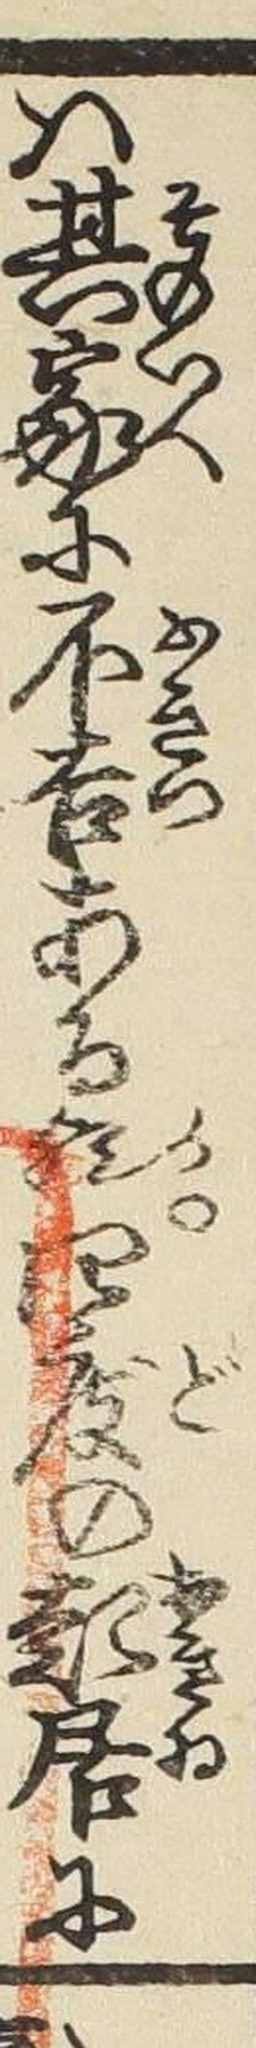は其家に不吉ある欤。四度の起居に
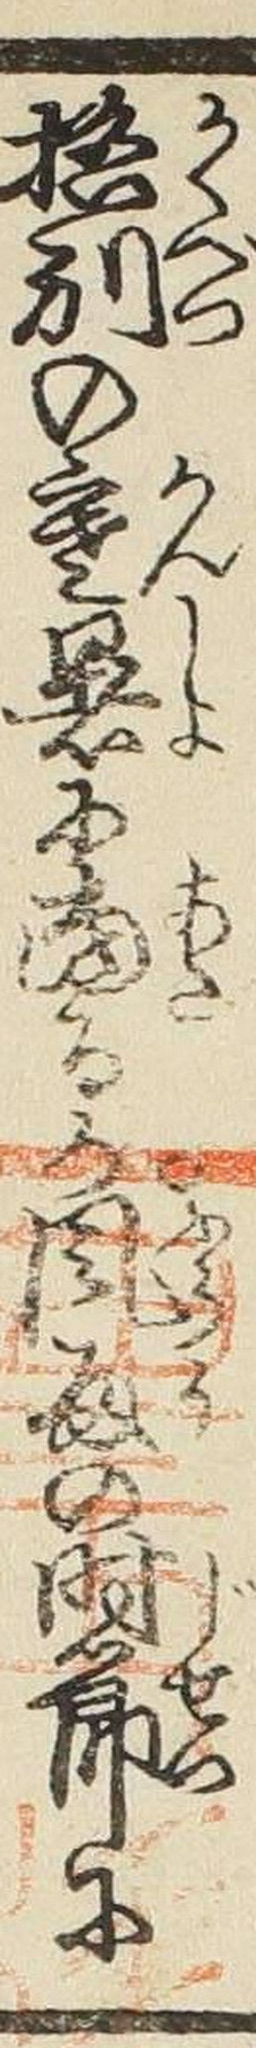格別の寒暑に当るか。風雨の時節に
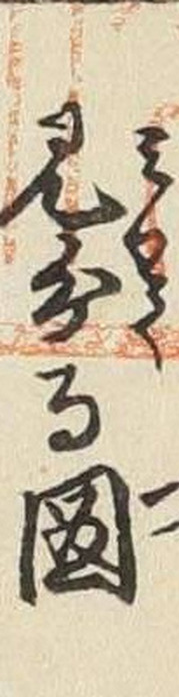見分る図
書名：養蠶圖解
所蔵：東京大学農学生命科学図書館 国文学研究資料館
